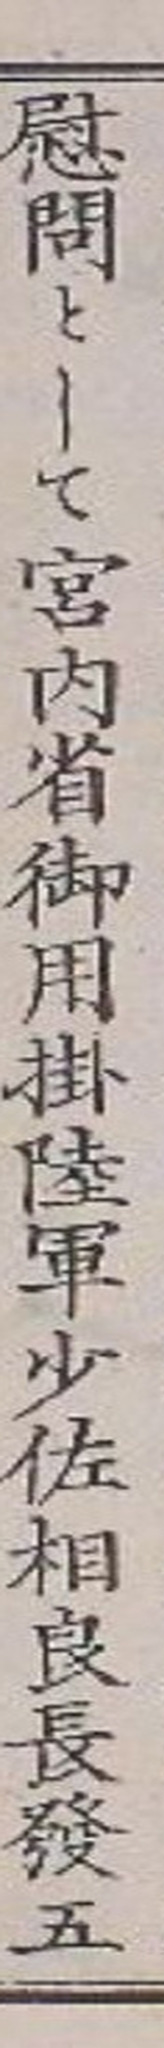慰問として宮内省御用係陸軍少佐相良長発五
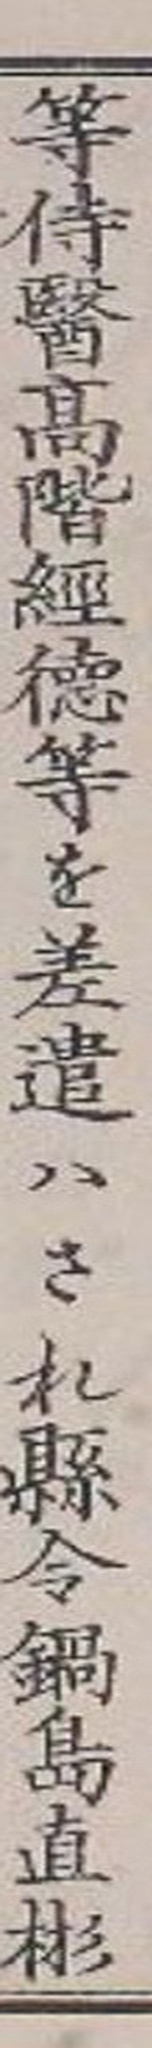等侍医高階経徳等を差遣はされ県令鍋島直彬
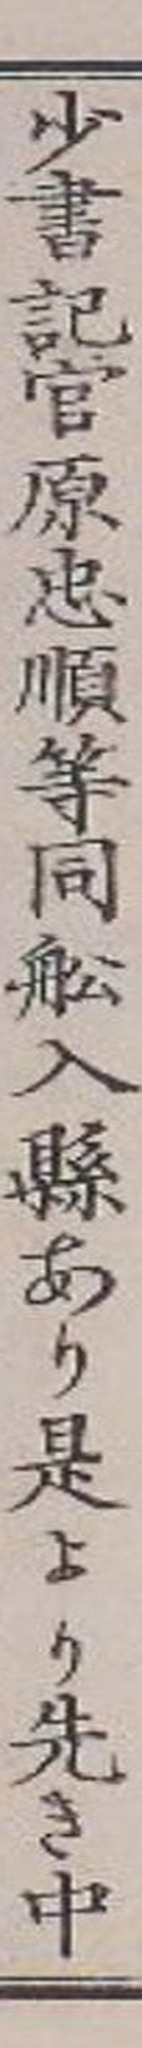少書記官原忠順等同船入県あり是より先き中

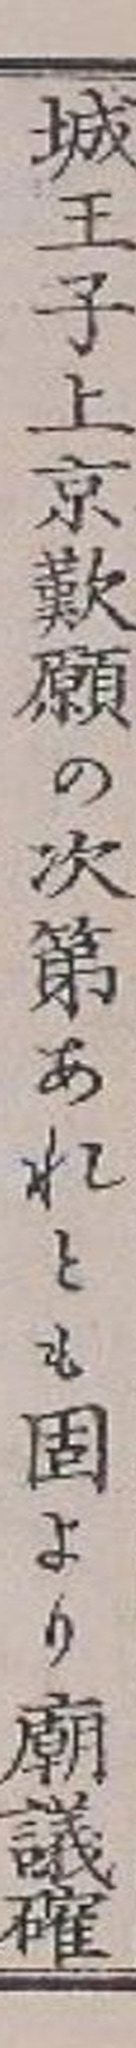城王子上京歎願の次第あれとも固より廟議確
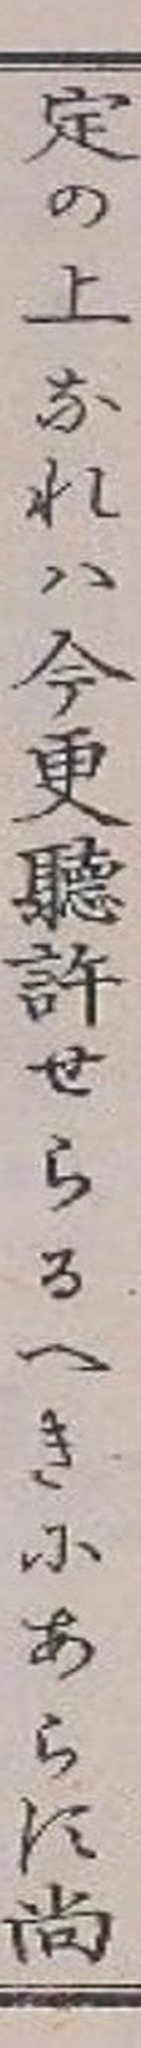定の上なれは今更聴許せらるへきにあらす尚
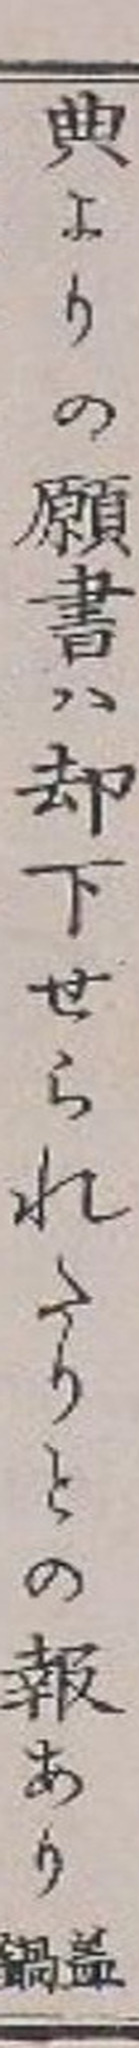典よりの願書は却下せられたりとの報あり盖鍋
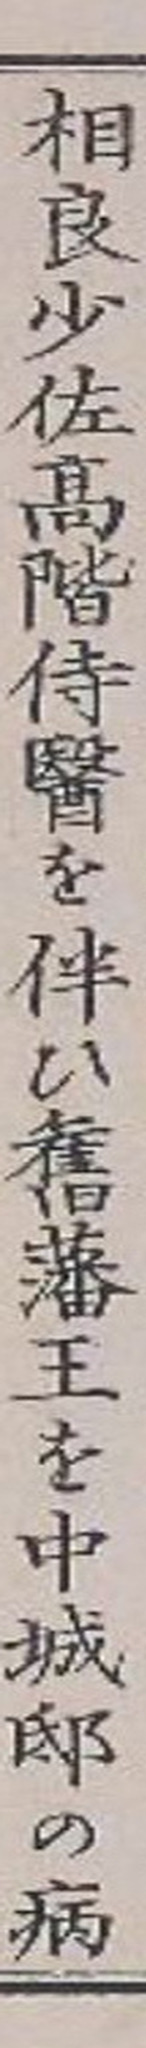相良少佐高階侍医を伴ひ旧藩王を中城邸の病
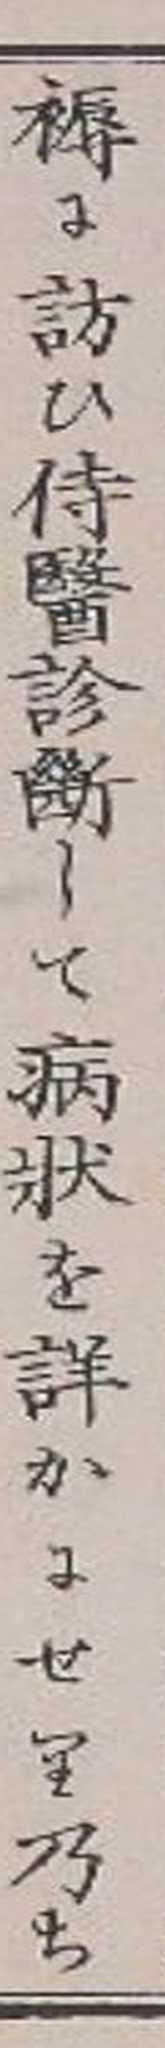褥に訪ひ侍医診断して病状を詳かにせり乃ち
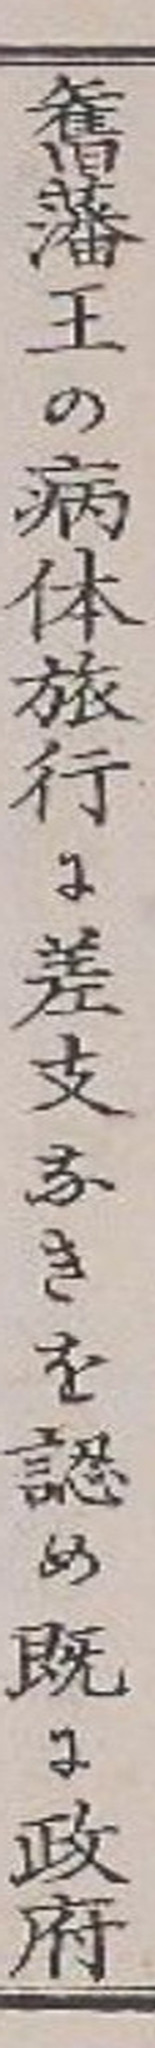旧藩王の病体旅行に差支なきを認め既に政府
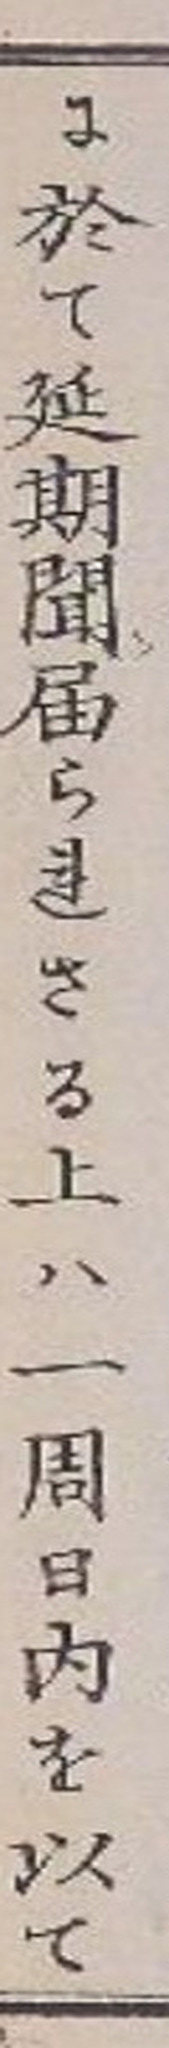に於て延期聞届られさる上は一周日内を以て
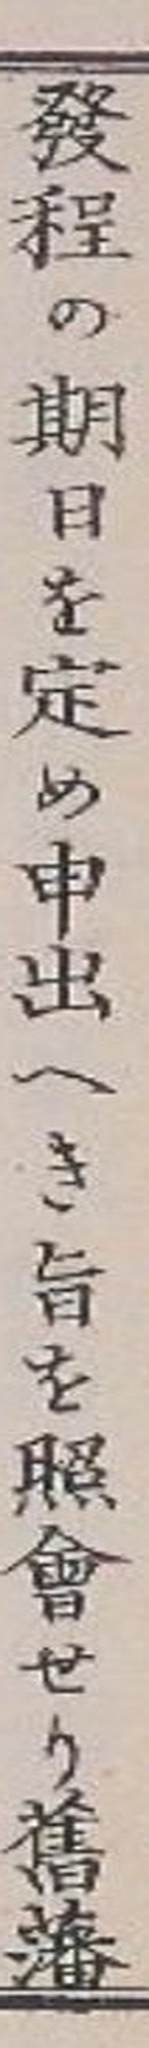発程の期日を定め申出へき旨を照会せり旧藩
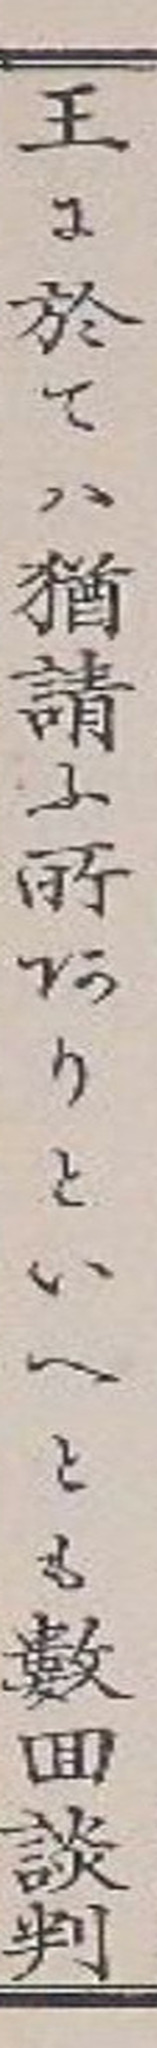王に於ては猶請ふ所ありといへとも数回談判
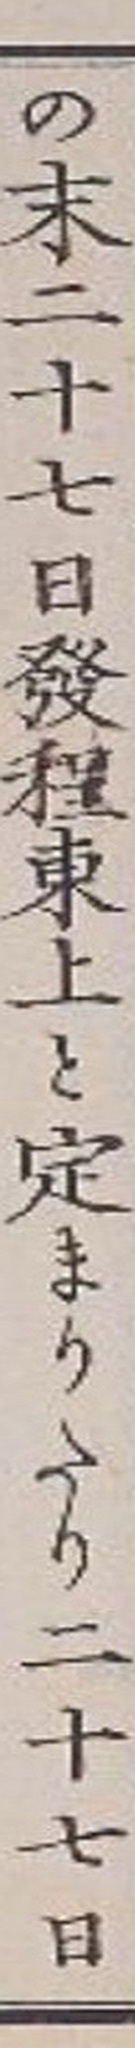の末二十七日発程東上と定まりたり二十七日
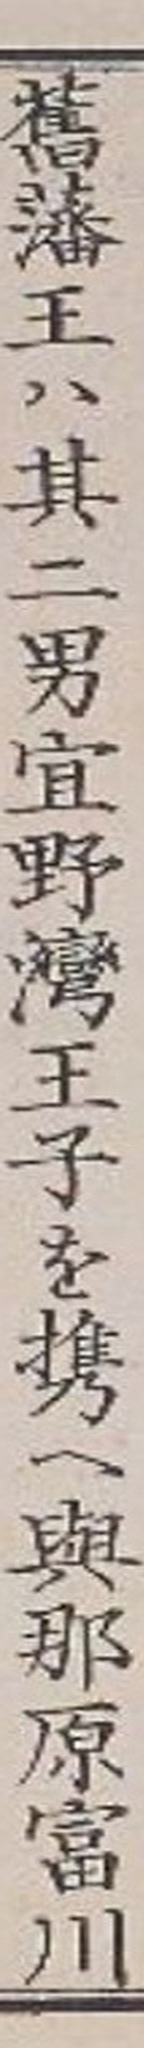旧藩王は其二男宜野湾王子を携へ与那原富川
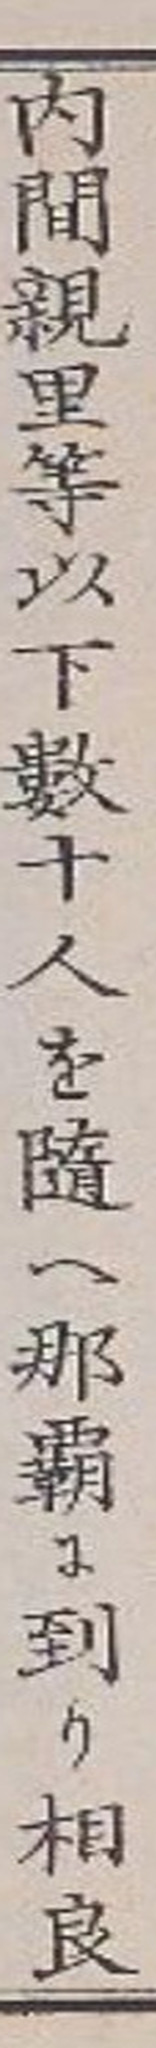内間親里等以下数十人を随へ那覇に到り相良
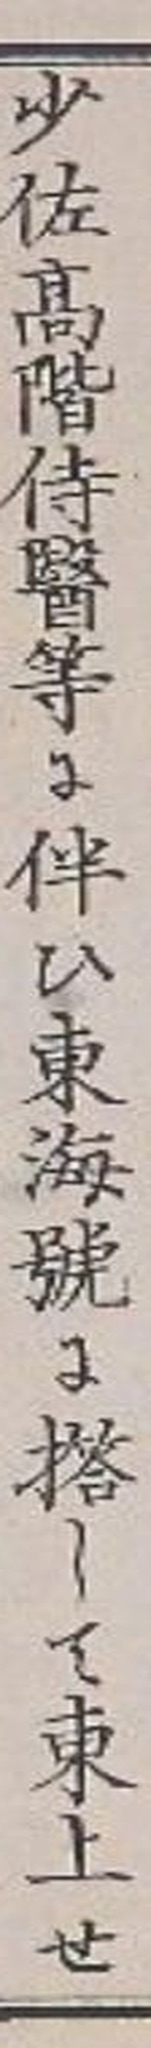少佐高階侍医等に伴ひ東海号に搭して東上せ
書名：南島紀事 下
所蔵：University of the Ryukyus Library
